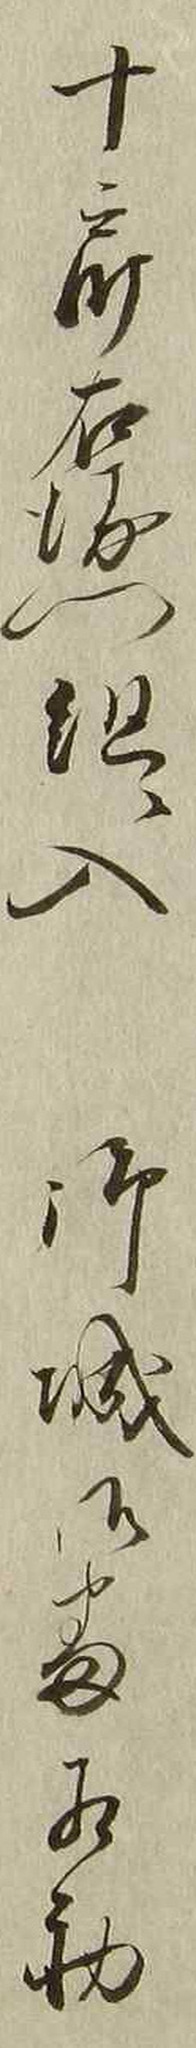十郎右衛門組ニ入御城御番相勤め
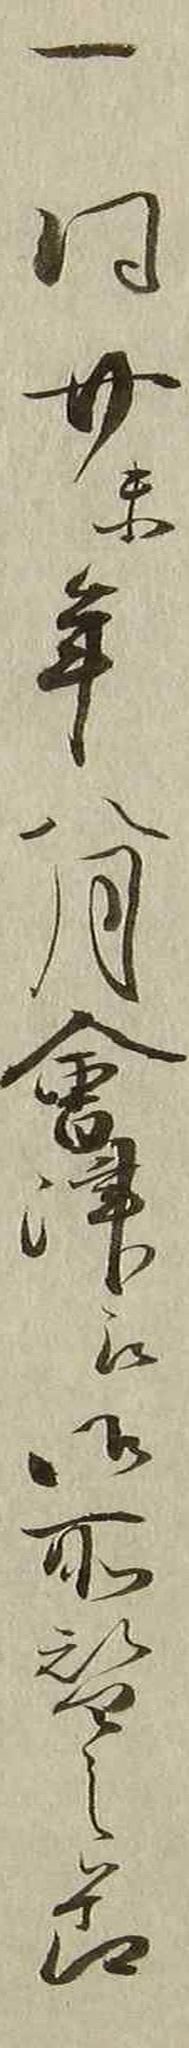一同廿未年八月会津へ御所替え之節
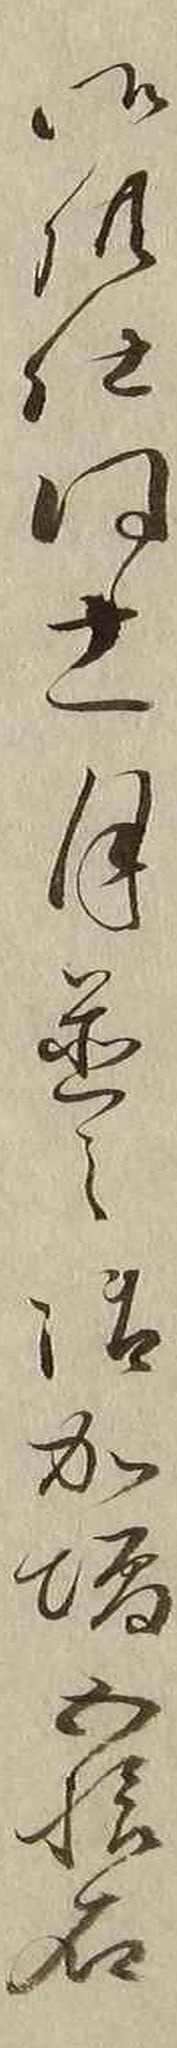御供仕り同十一月並み之御加増五拾石
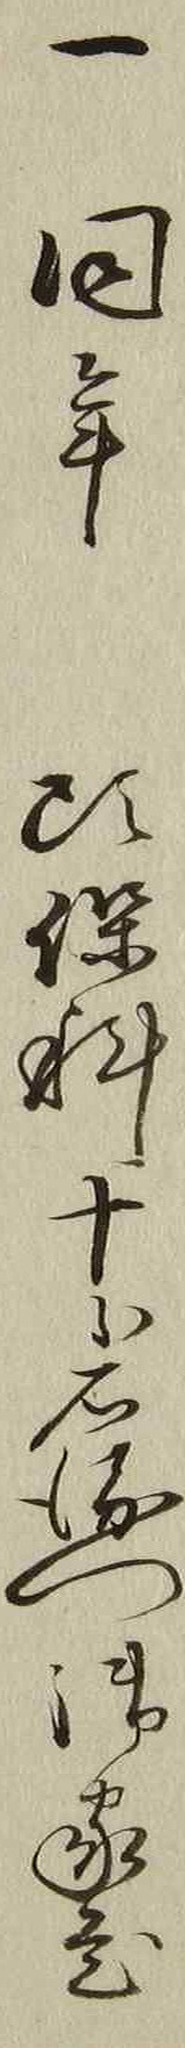一同年頭保科十郎右衛門御家老
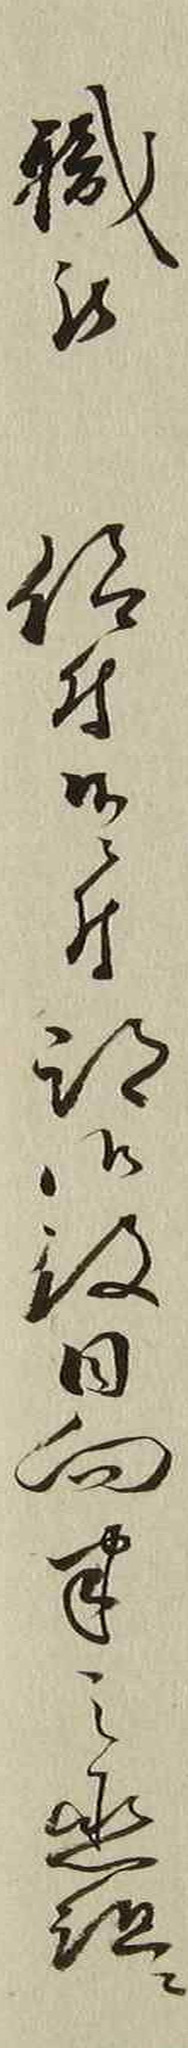仰せ付けられ候ニ付き跡御役日向半之丞組ニ
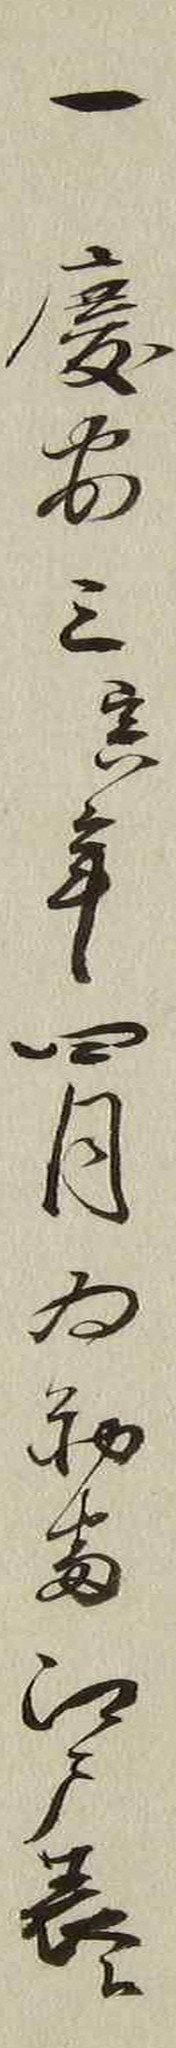一慶安三寅年四月勤番之為江戸表へ
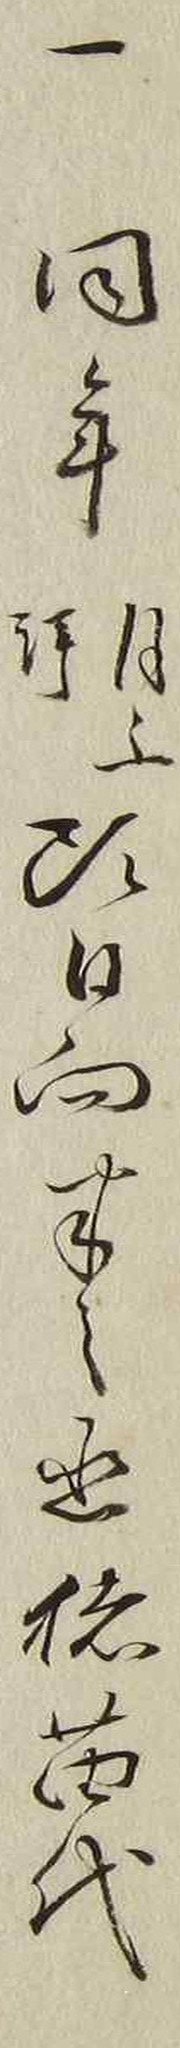一同年月不詳頃日向半之丞猪苗代

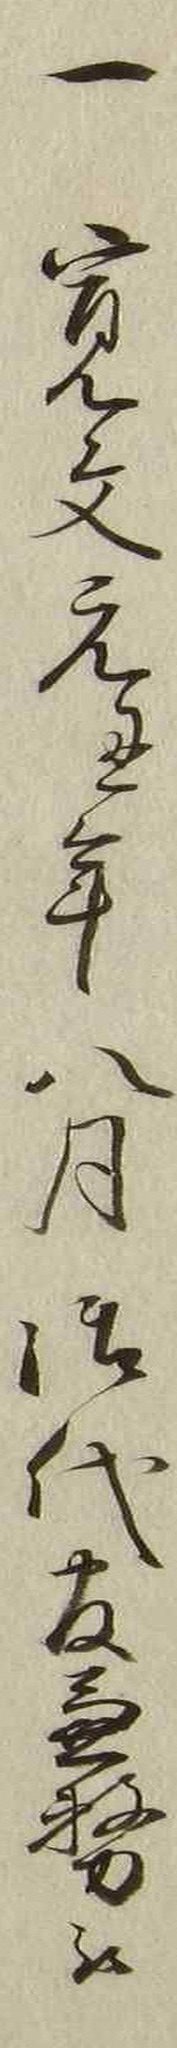一寛文元々丑年八月御代官兼務
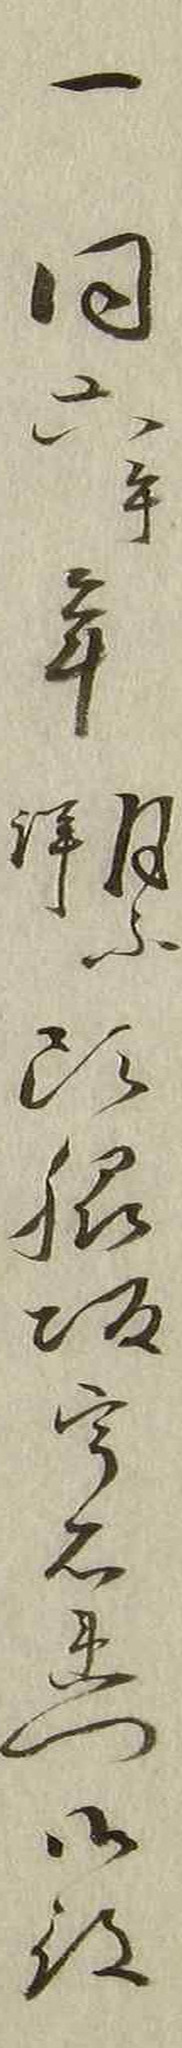一同六午年月不詳頭脇坂宇右衛門御役
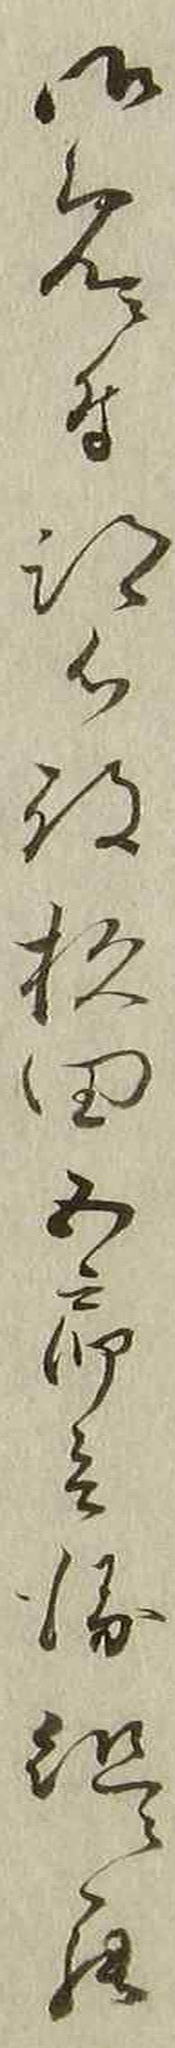御免ニ付き跡御役杉田五郎兵衛組ニ罷り
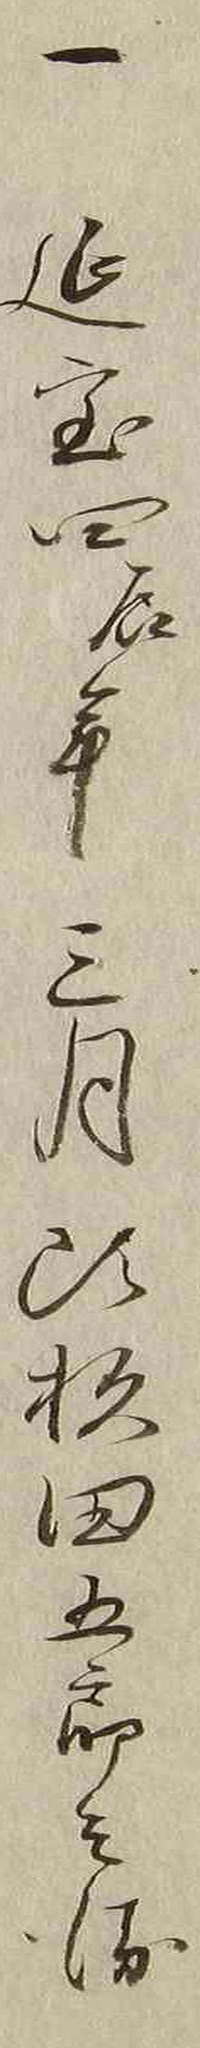一延宝四辰年三月頃杉田五郎兵衛
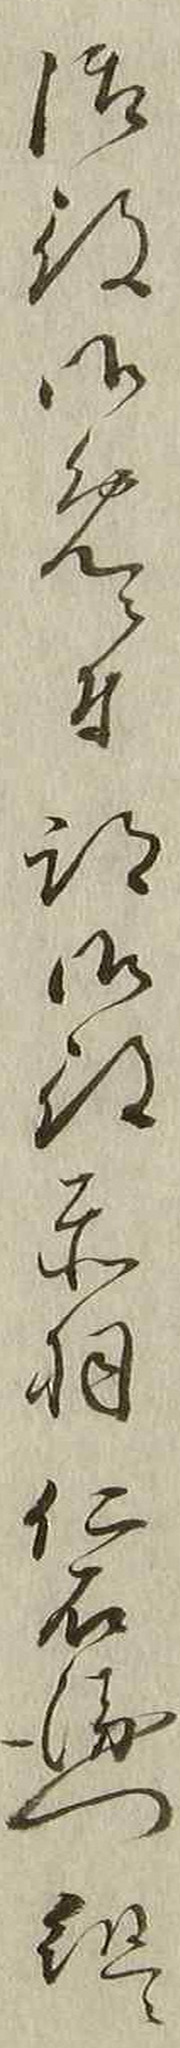御役御免付き跡御役赤羽仁右衛門組ニ
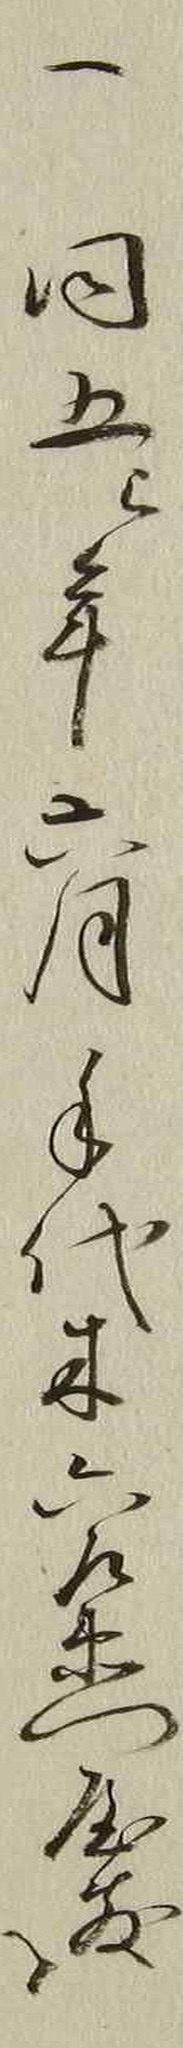一同五巳年六月手代木六左衛門屋敷を
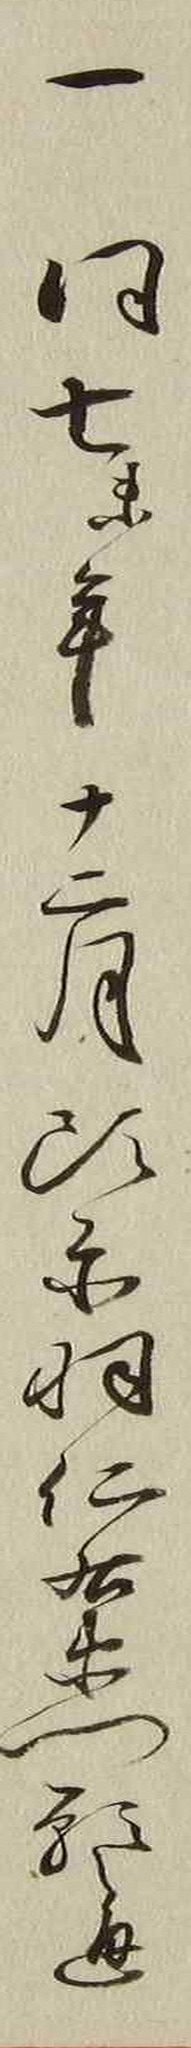一同七未年十二月頃赤羽仁右衛門願い之通り
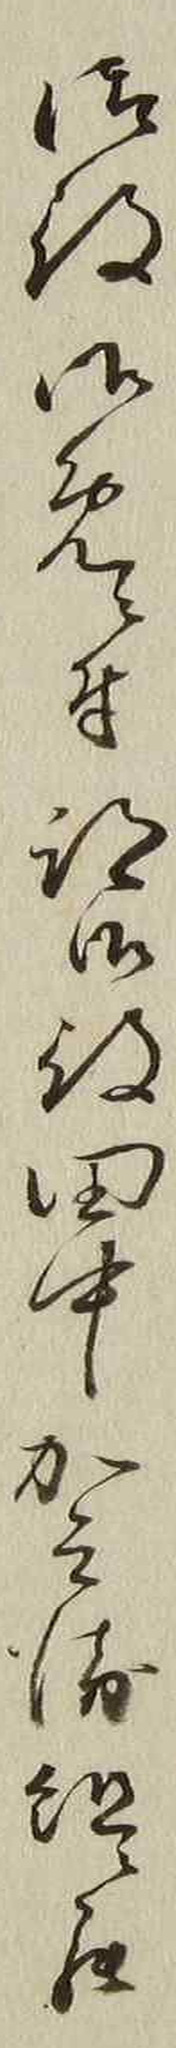御役御免ニ付き跡御役田中加之輔組ニ罷り
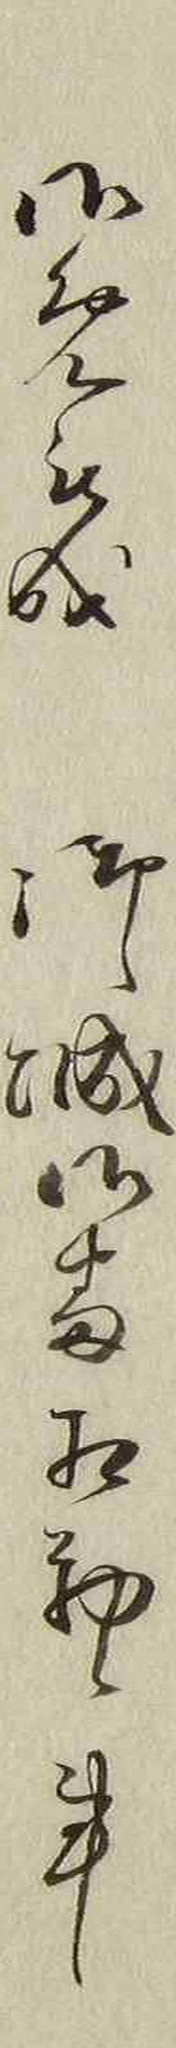御免成られ御城御番相勤め候事
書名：諸士系譜　巻之20　い之部20
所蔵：会津若松市立会津図書館
